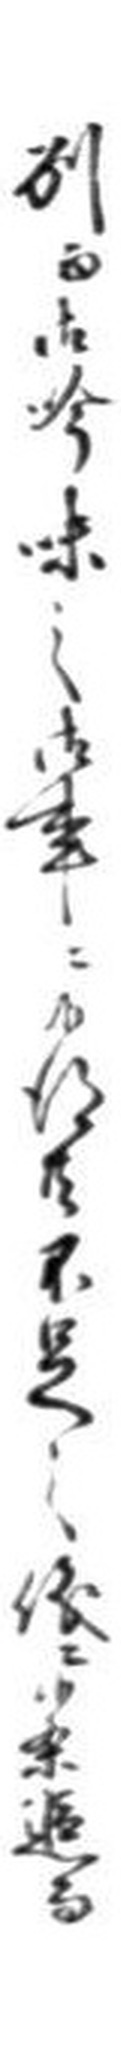別而御吟味之御事ニ候得共不足之儀ニ候条追而
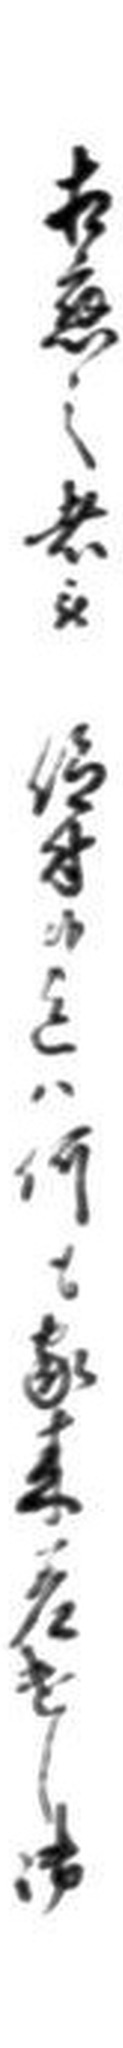相応之者被仰付候迄ハ何も家来差遣し御
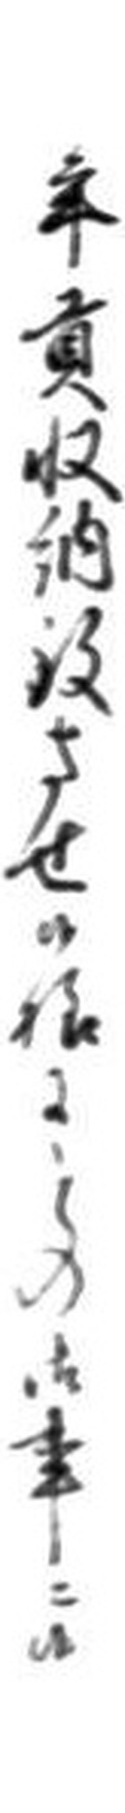年貢収納致させ候様にとの御事ニ候
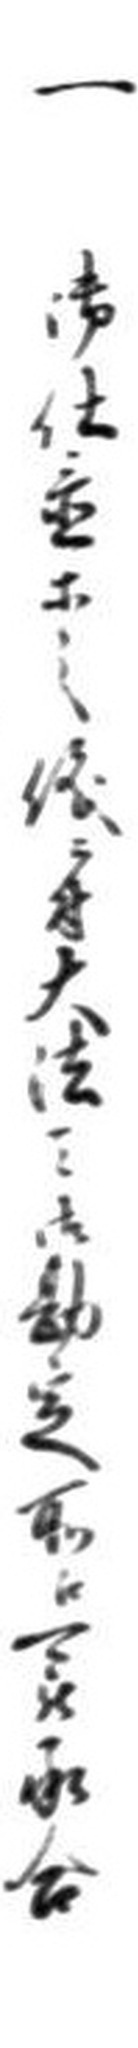一御仕置等之儀ニ付大法者御勘定所江可被承合
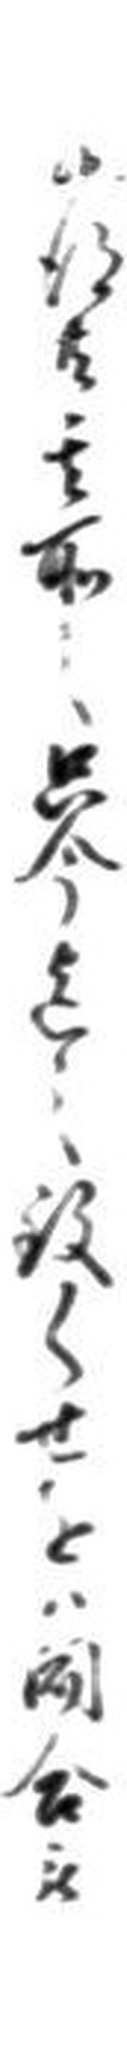候得共其所之只今迄之致くせをハ聞合被
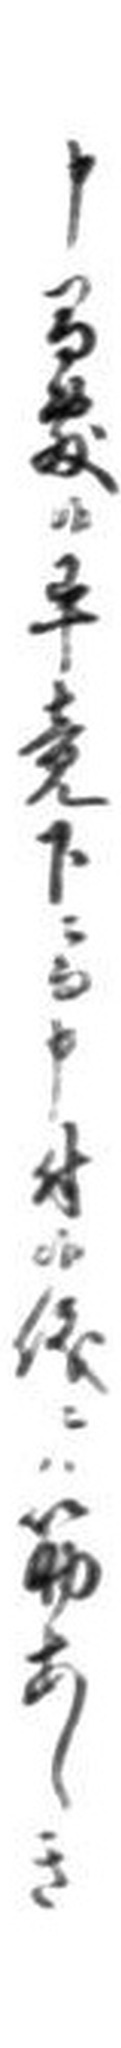申間敷候畢竟下ニ而申付候儀ニハ筋あしき
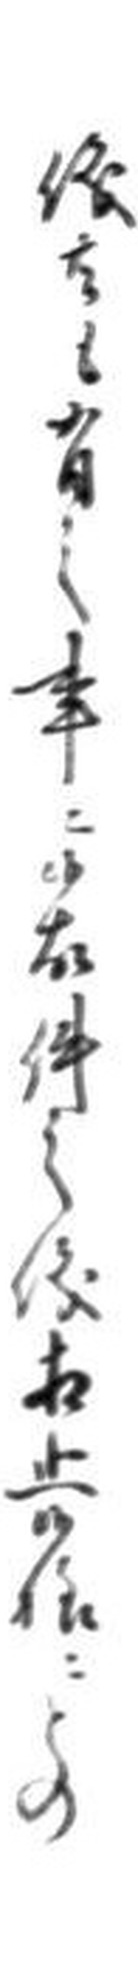儀共も有之事ニ候故件之儀相止候様ニとの
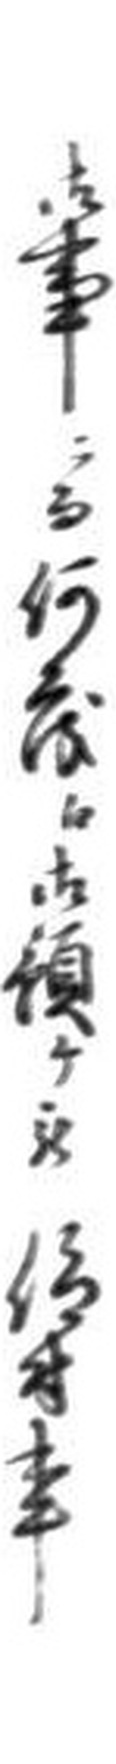御事ニ而何茂江御預ケ被仰付事
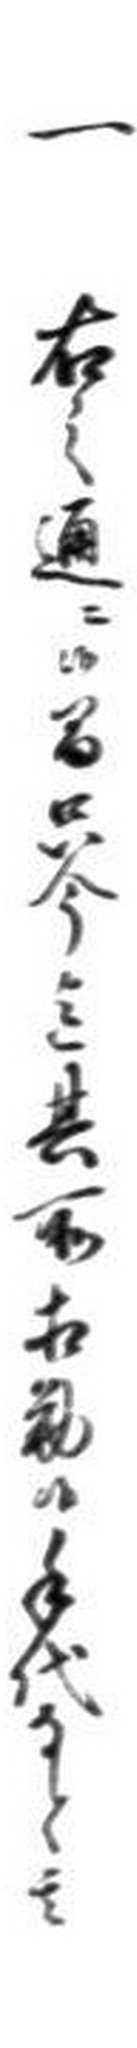一右之通ニ候間只今迄其所相勤候手代なと其
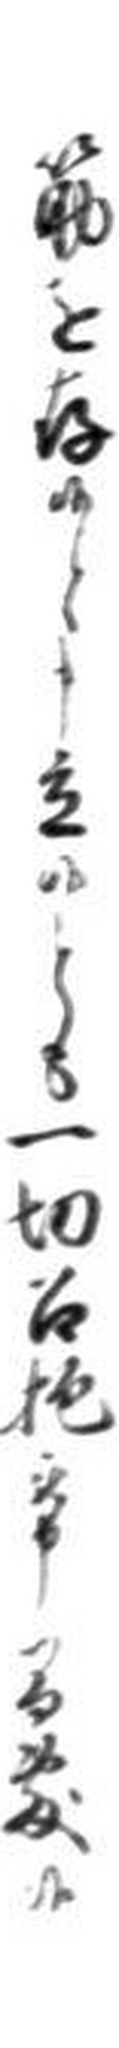筋を存候と申立候とも一切召抱被申間敷候

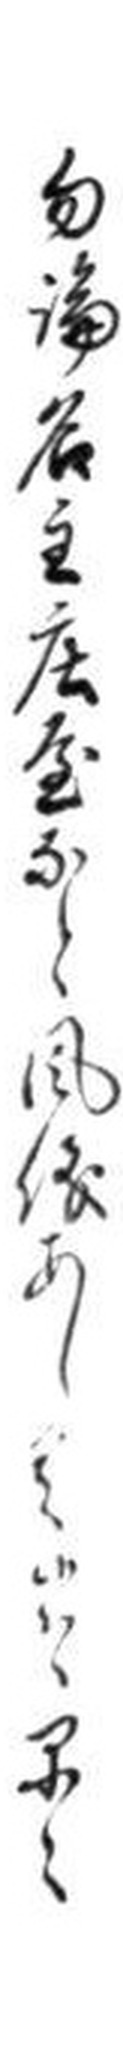勿論名主庄屋なと風儀あしく候ハヽ早々
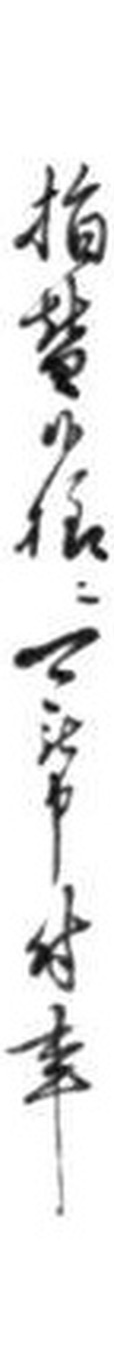指替候様ニ可被申付事
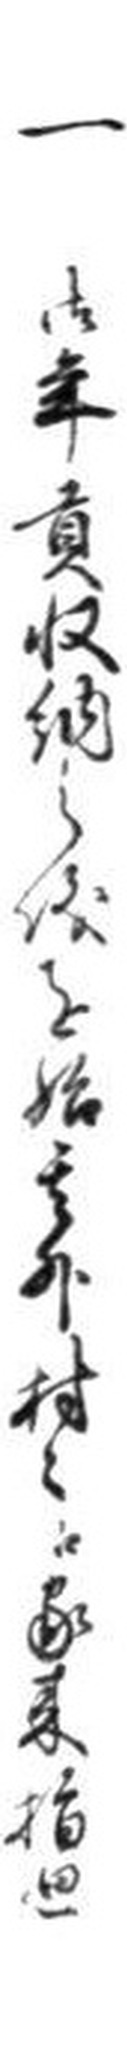一御年貢収納之儀を始其外村々江家来指廻
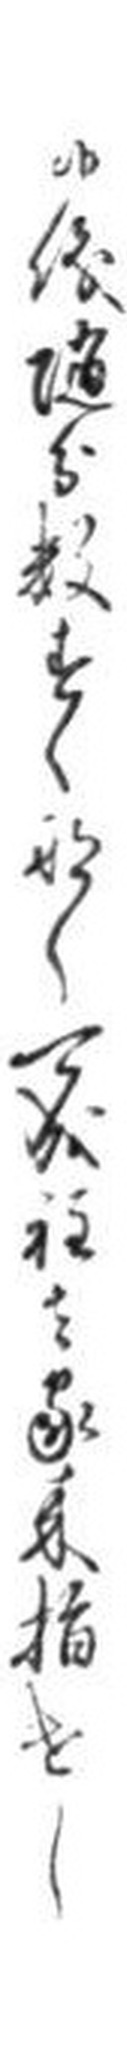候儀随分数すくなく可成程者家来指遣し
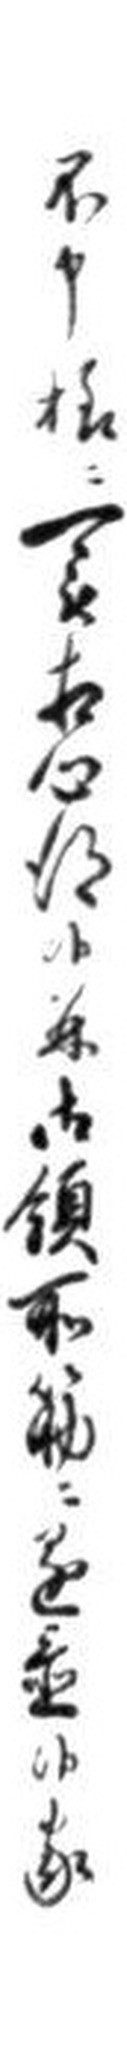不申様ニ可被相心得候并御領所筋ニ懸置候家
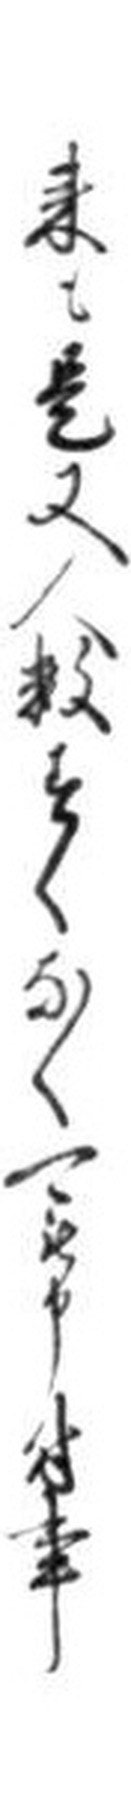来も是又人数すくなく可被申付事
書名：家譜 三十四 吉邦公 従享保五年到同六年
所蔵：福井県文書館 Fukui Prefectural Archives
